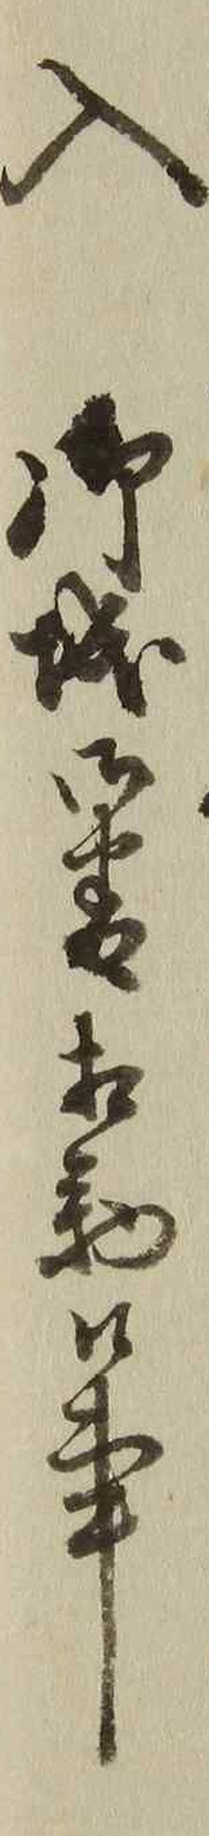入御城御番相勤候事
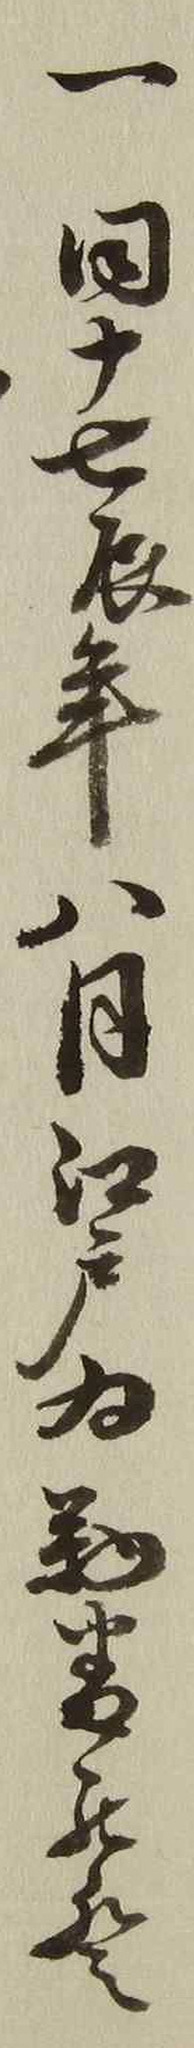一同十七辰年八月江戸為勤番罷登
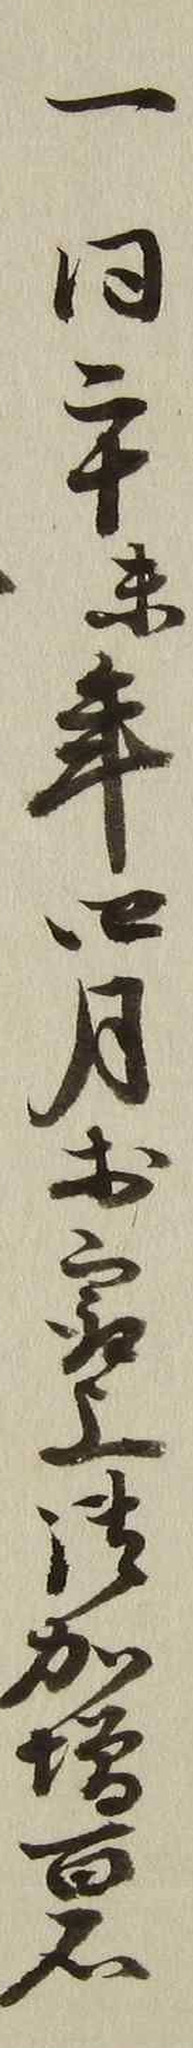一同二十未年四月於最上御加増百石
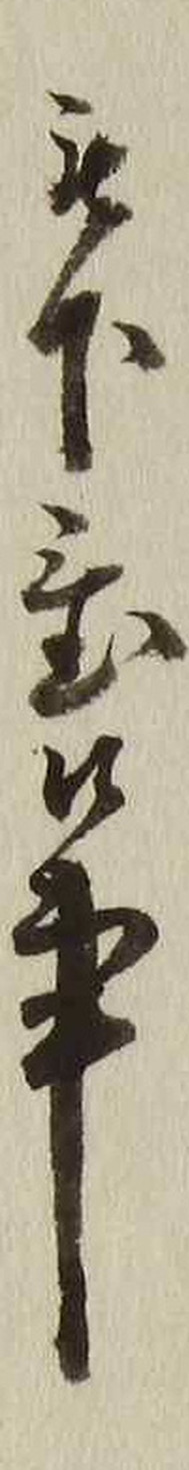被下置候事
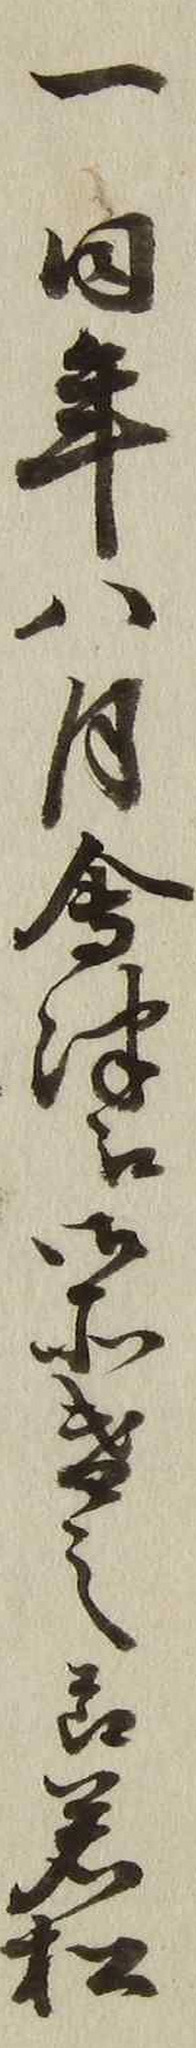一同年八月会津江御所替之節若松
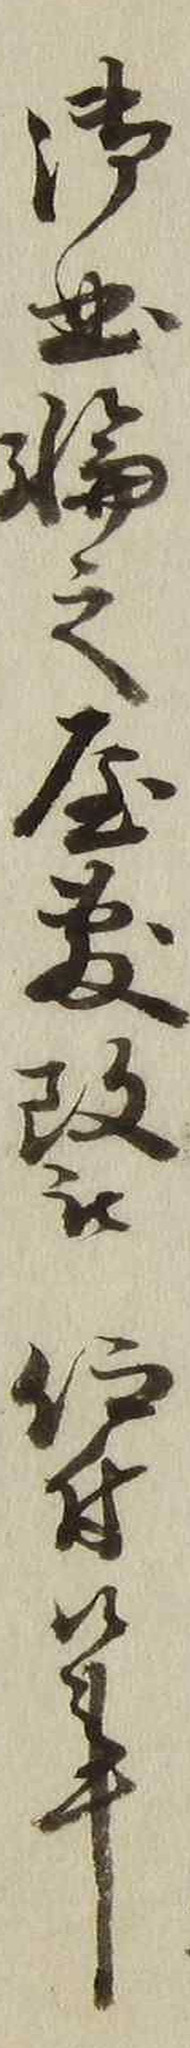御曲輪之屋敷改被仰付候事
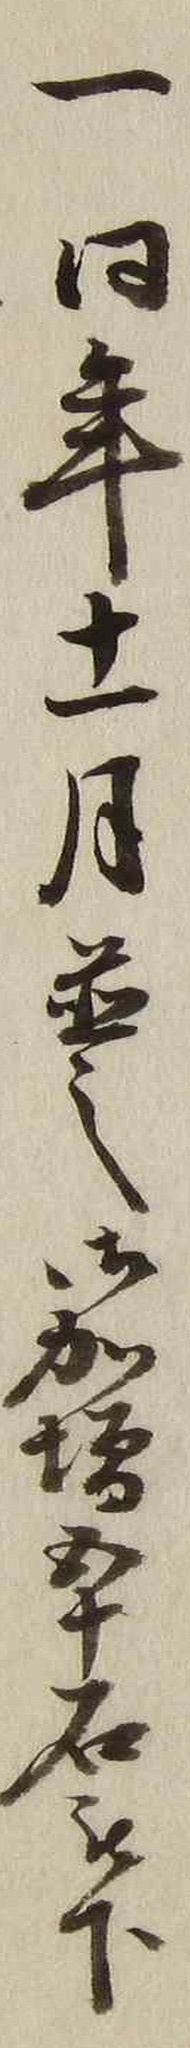一同年十一月並之御加増五十石被下
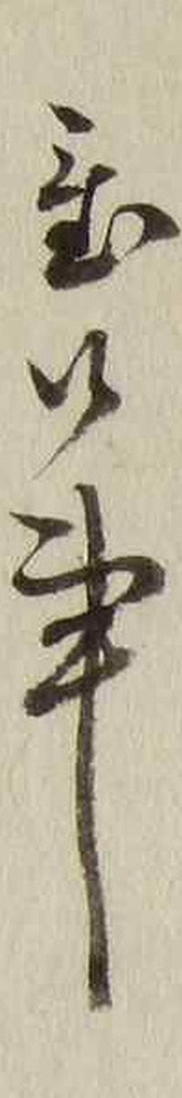置候事
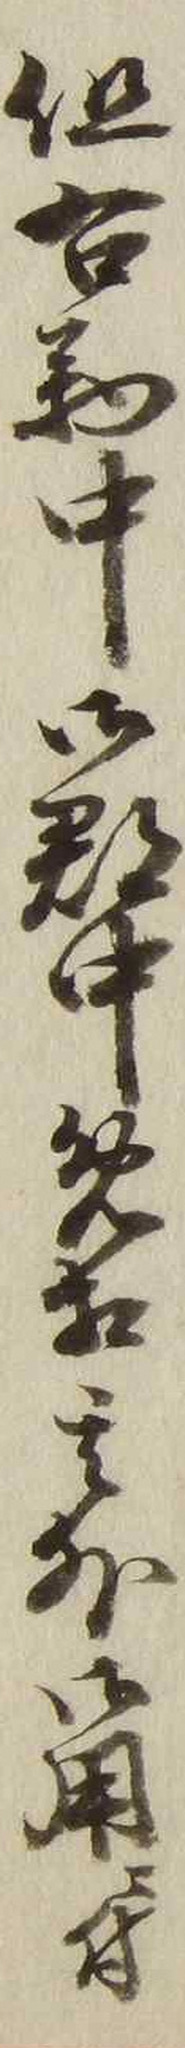但右勤中御郡中免相其外御用ニ付

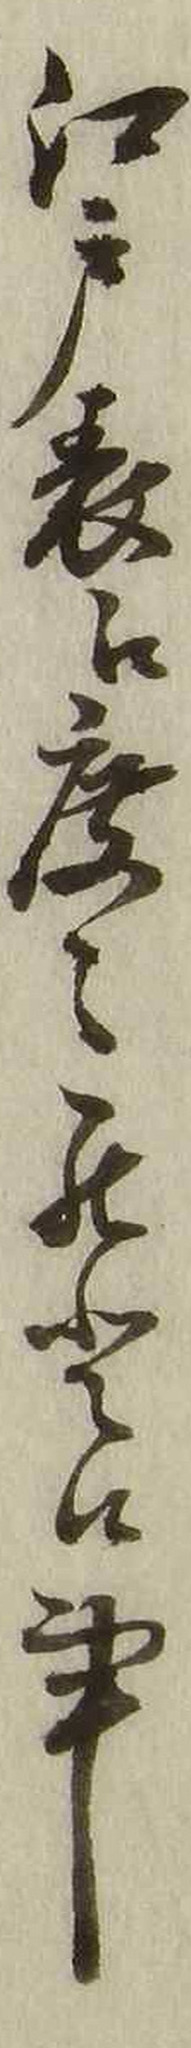江戸表江度々罷登候事
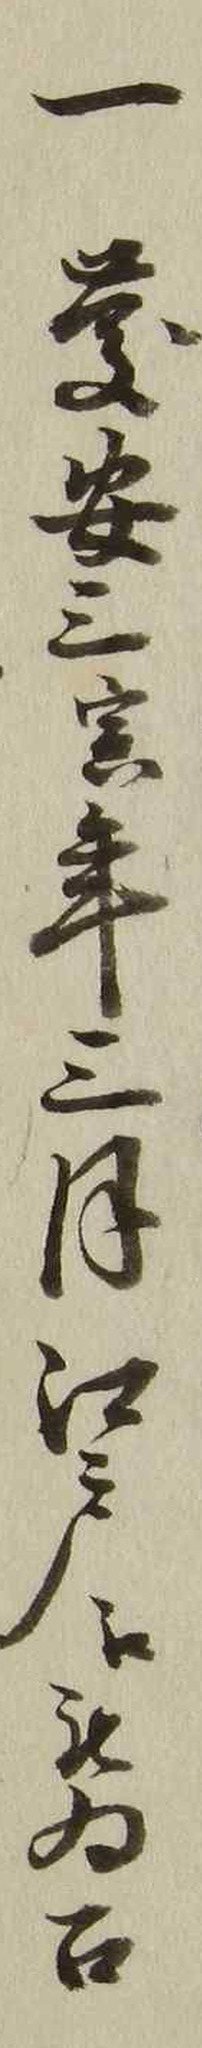一慶安三寅年三月江戸江被為召
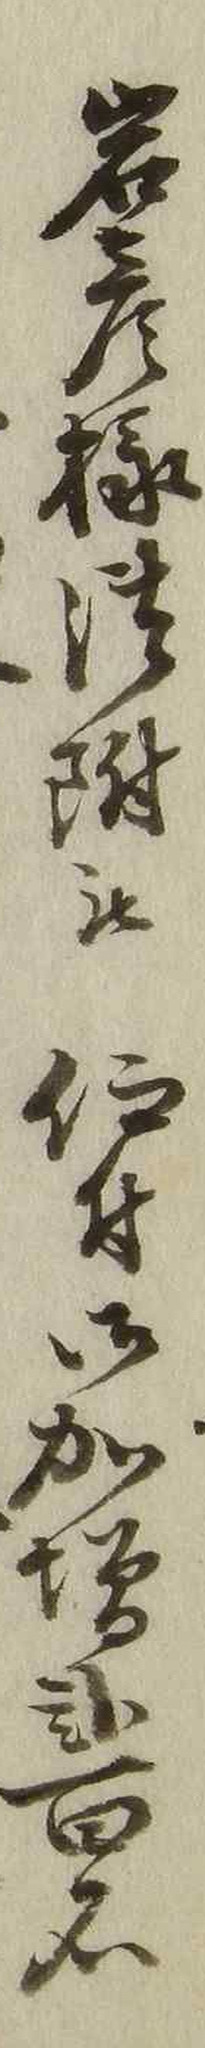岩彦様御附被仰付御加増弐百石
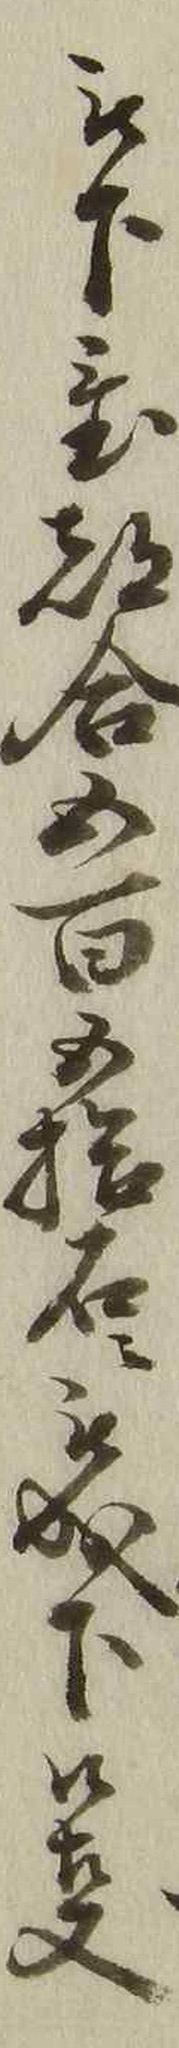被下置都合五百五拾石ニ被成下候事
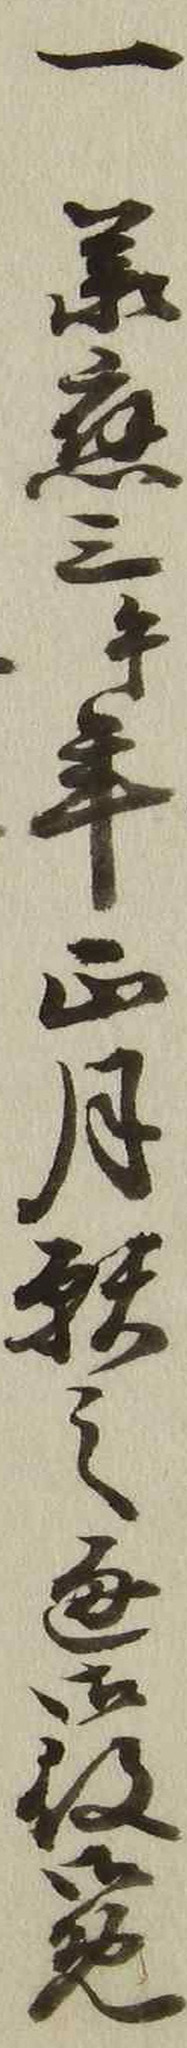一承応三午年正月願之通御役御免
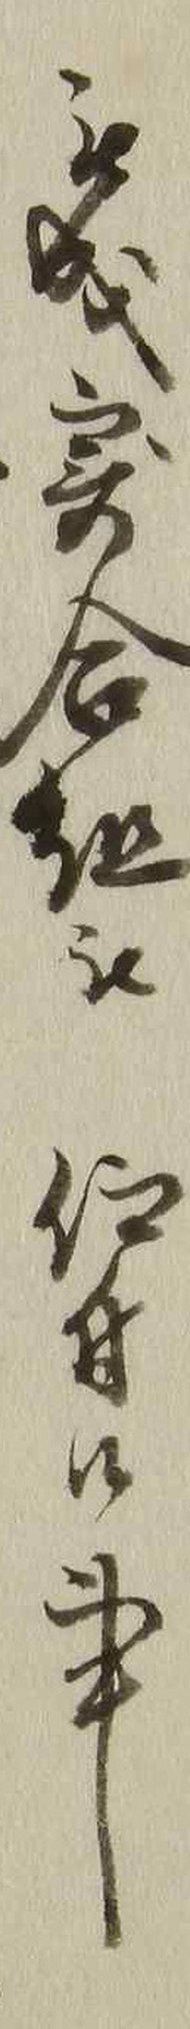被成寄合組被仰付候事
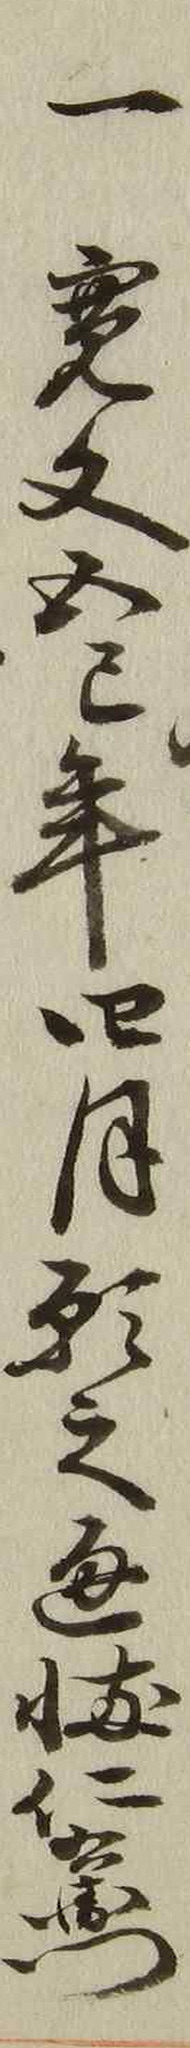一寛文五巳年四月願之通忰仁右衛門
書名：諸士系譜　巻之31　い之部31
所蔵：会津若松市立会津図書館
